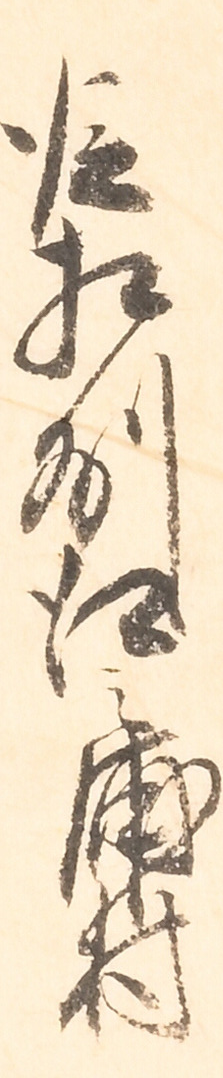従相州江之浦
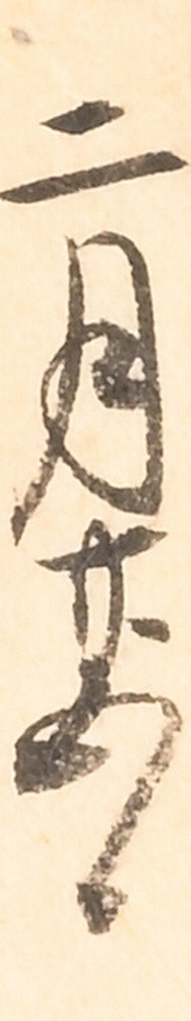二月廿五日
